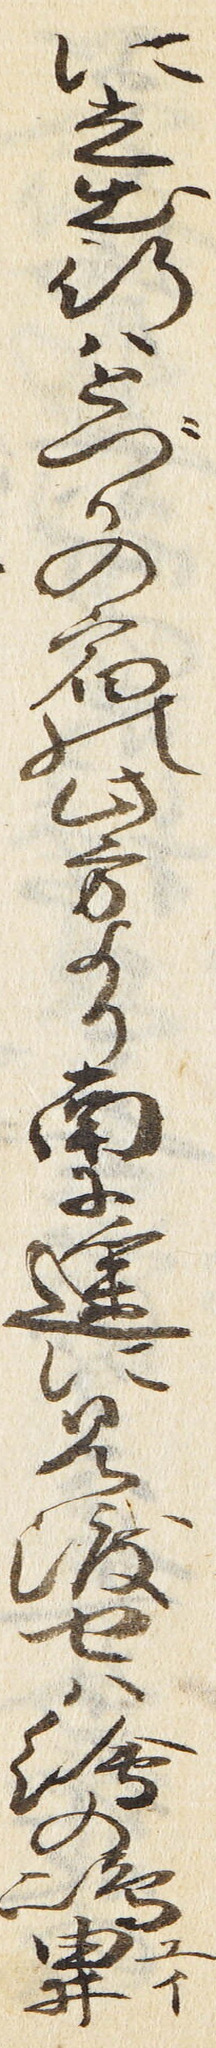に立出行はとづかの宿の此方より南に遥に見渡せは絵の嶋由井
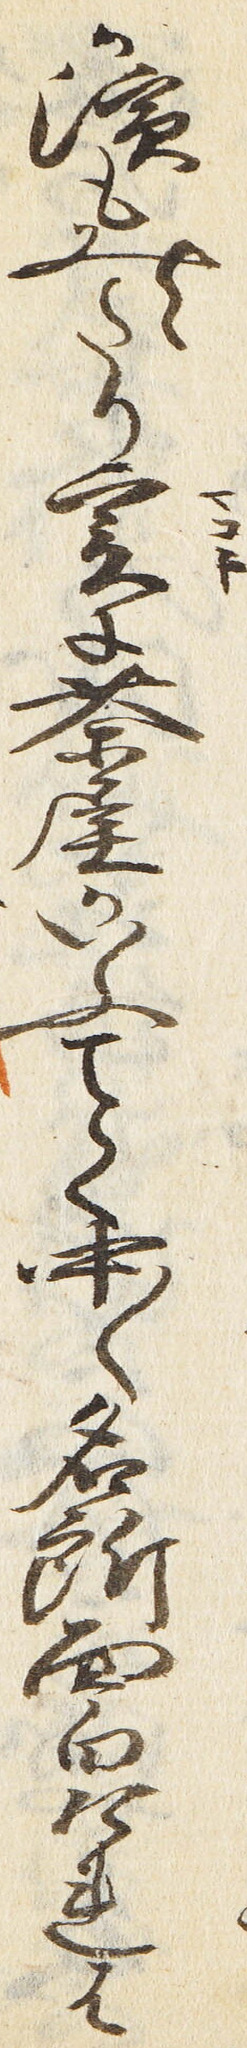か浜もみえたり実に茶屋かいふことく中〳〵名所面白けれは
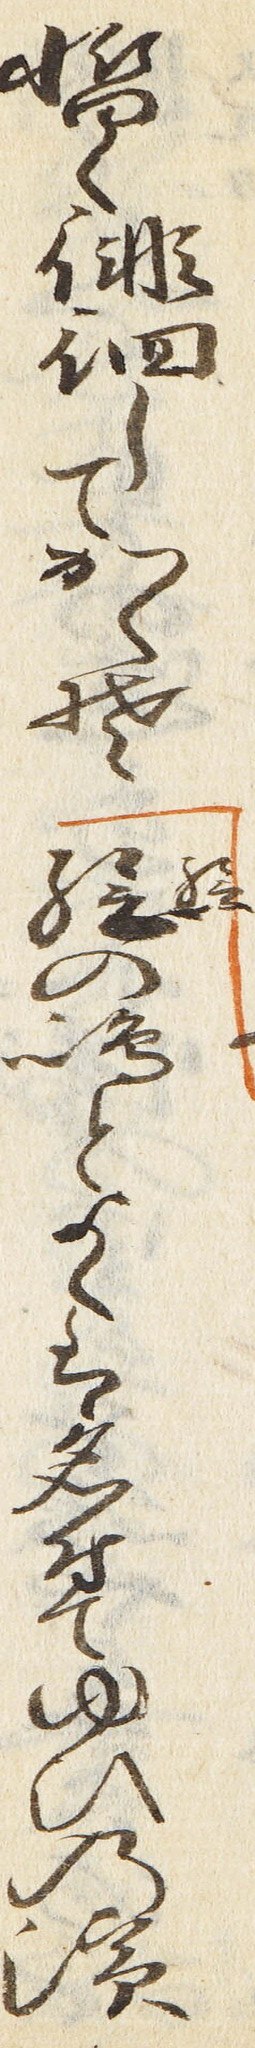暫く徘徊してかくそ「絵の嶋とよくは名付てゆひの浜
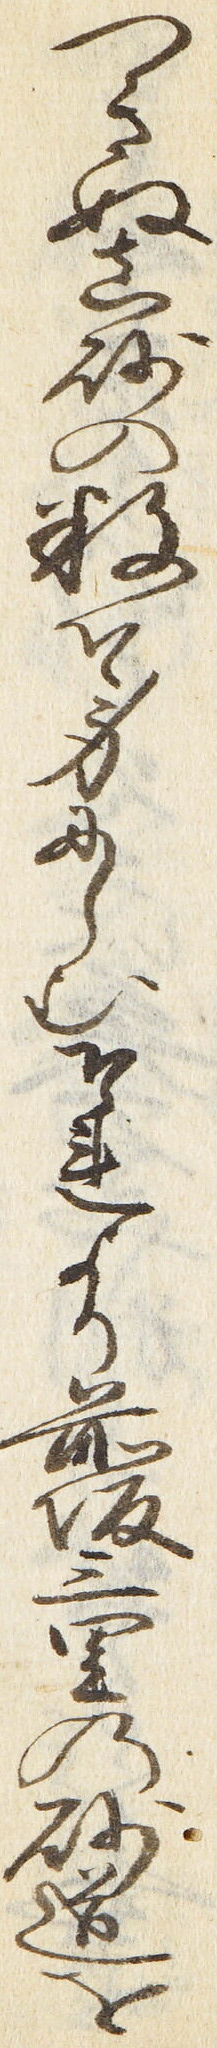つきぬ真砂の数そ身にしむそれより前坂三里の砂道を
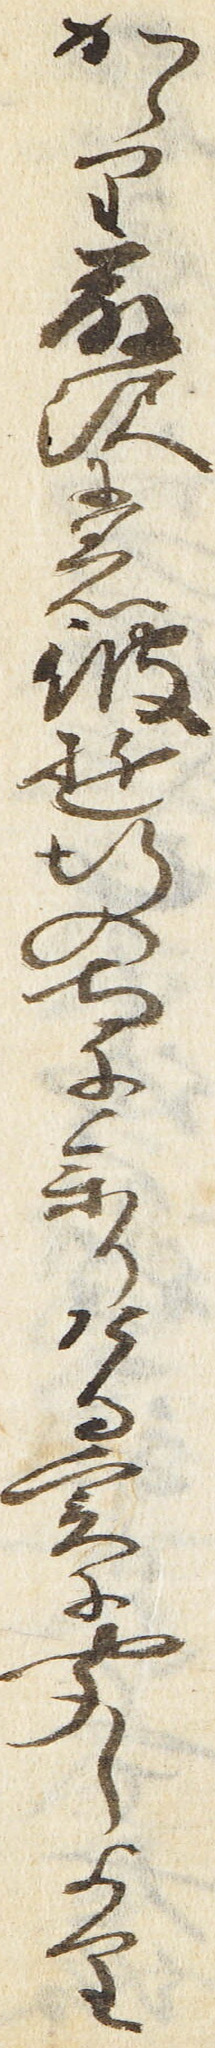かゝり藤沢に着彼遊行の寺に参りける実に聞しより
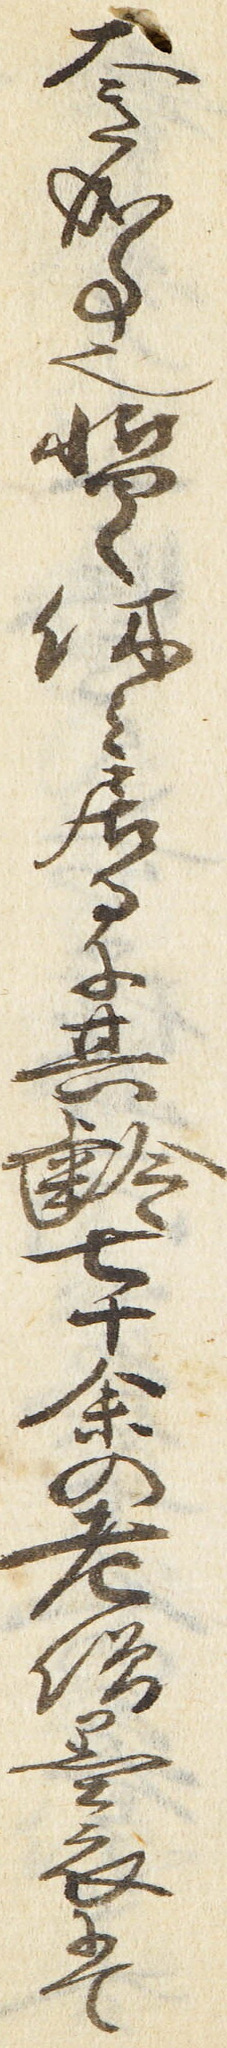大き成事也暫く休み居るに其齢七十余の老僧墨衣にて
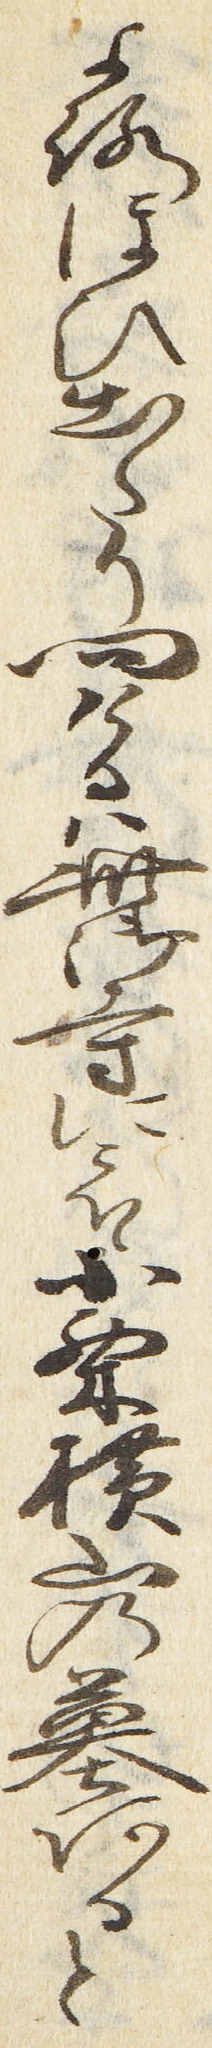よろほひ出たり問けるは此御寺にこそ小栗横山の墓あると

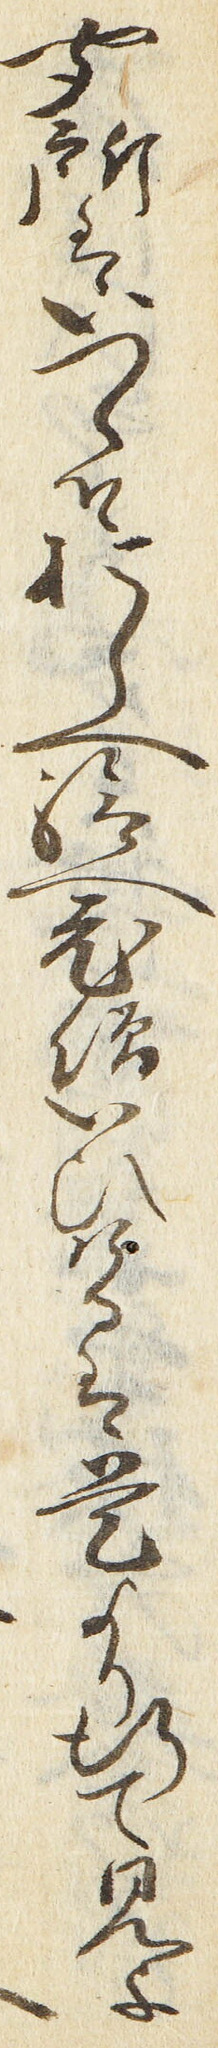聞所はいつくそおしへ給へ老僧いひけるは是より行て見よ
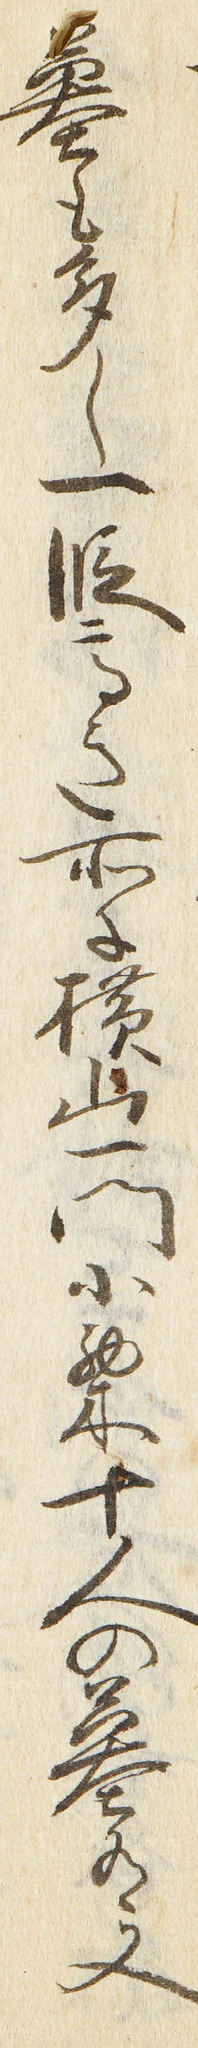墓も多し一段高き所に横山一門小栗十人の墓有又
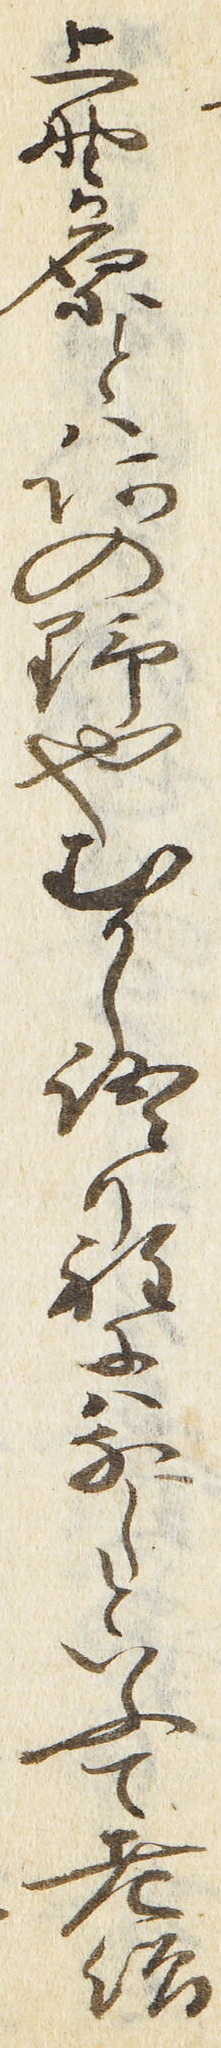上野か原とは何の野やむかし語り程にはなしといふて老僧
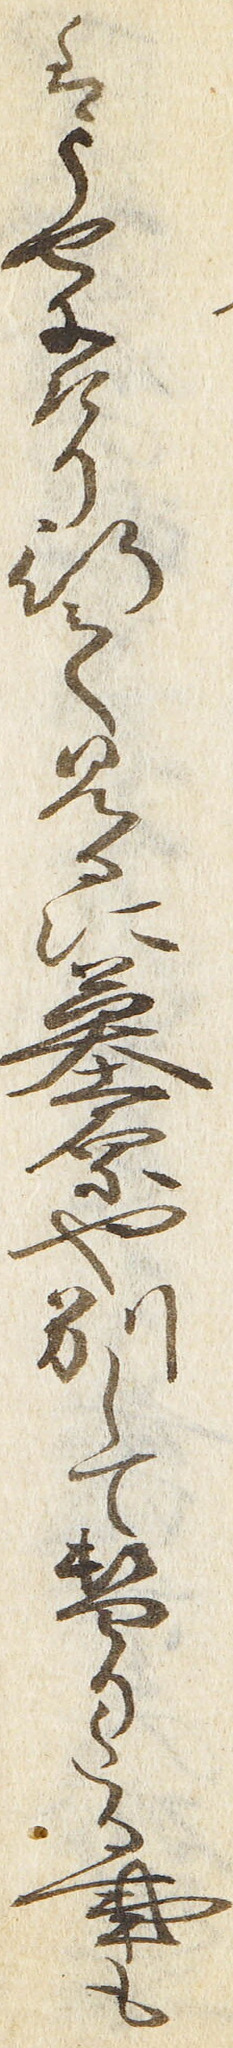は申せにけり行て見るに墓原や別して替りたる事も
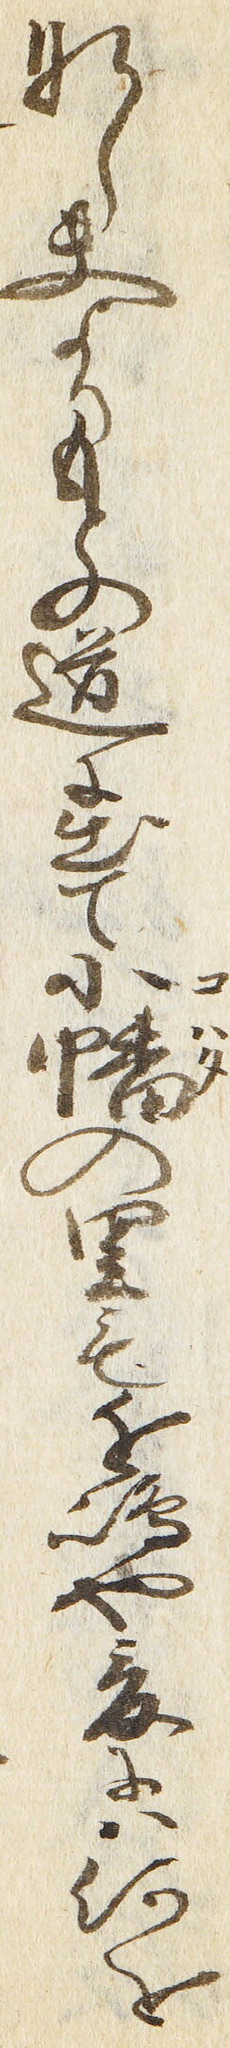なし夫よりもとの道に出て小幡の里も近嶋や爰には何を
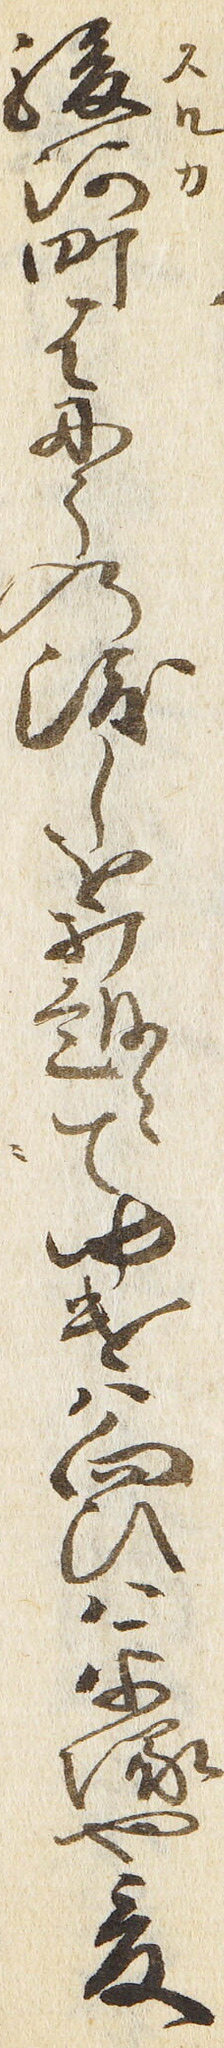駿河町はにうの渡しを打越えてゆけは向ひは平塚や爰
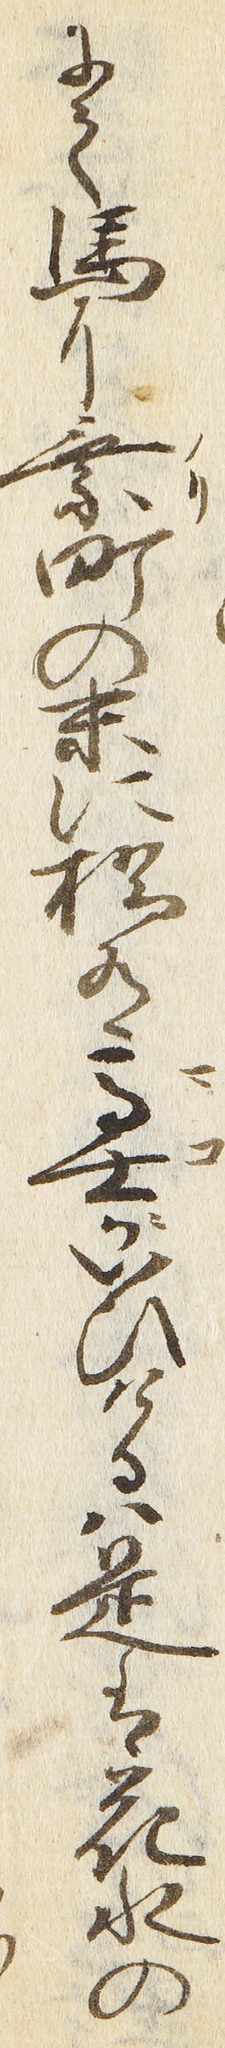にて馬に乗町の末に橋有馬士がいひけるは是は花水の
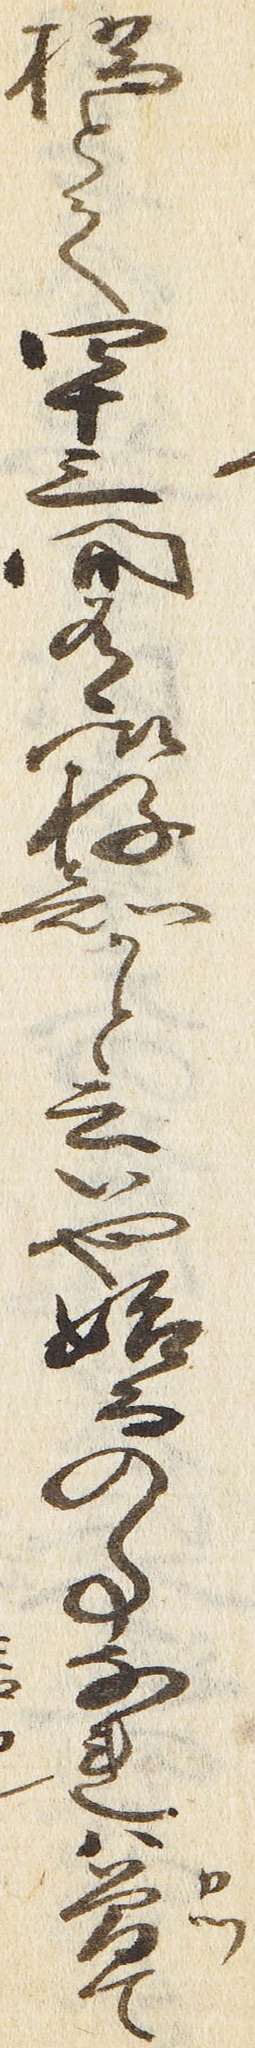橋とて四十三間有御存知かと云いや始而の事なれは曽て
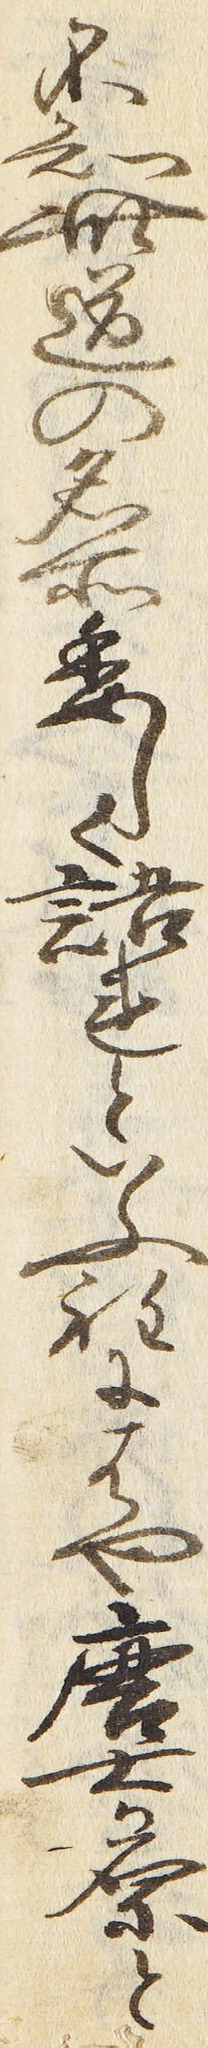不知此道の名所委しく語れといふ程にはや唐土か原と
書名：海陸世話日記
